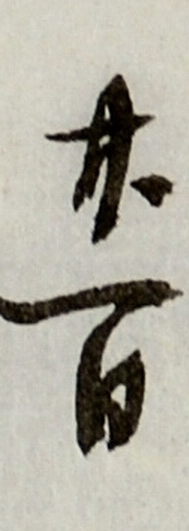廿一日
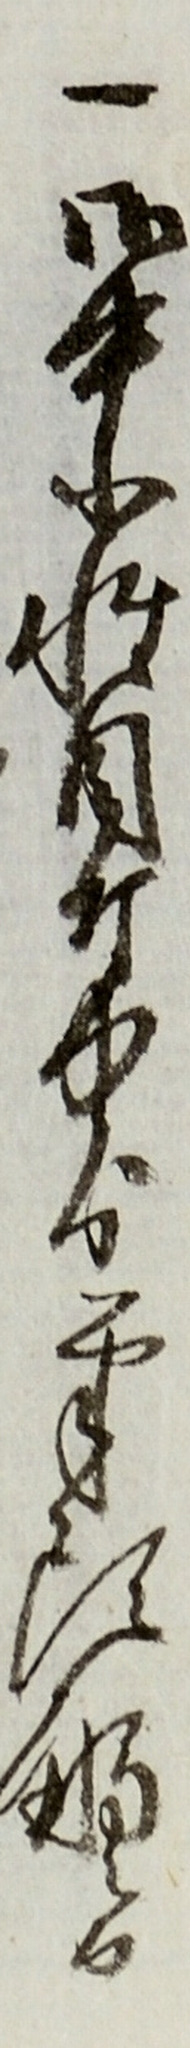一御中小性目付中ゟ筆頭触ニ而
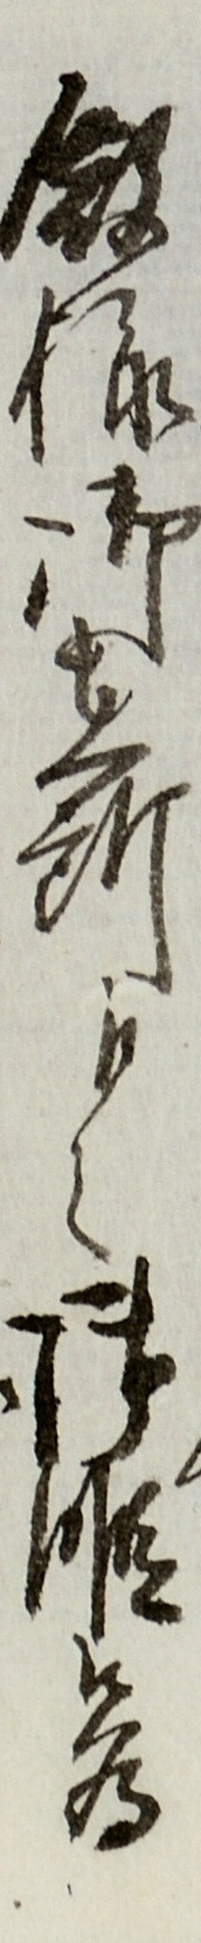殿様御在所江之御暇被為
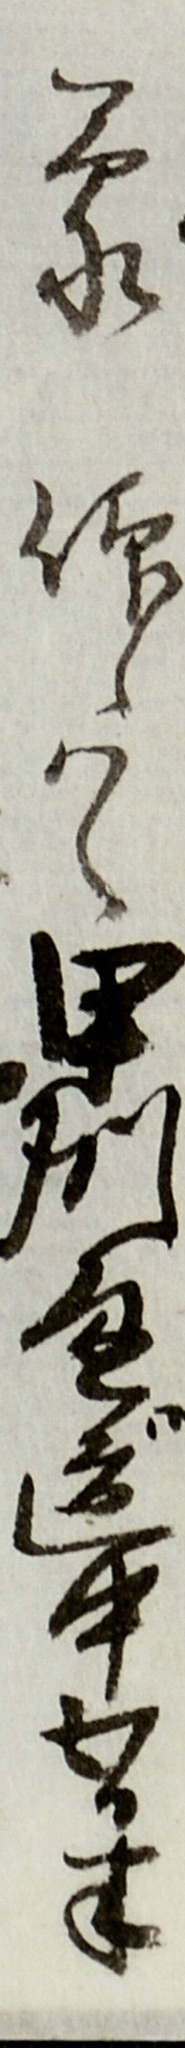蒙仰候ハヽ甲州通御道中五日半
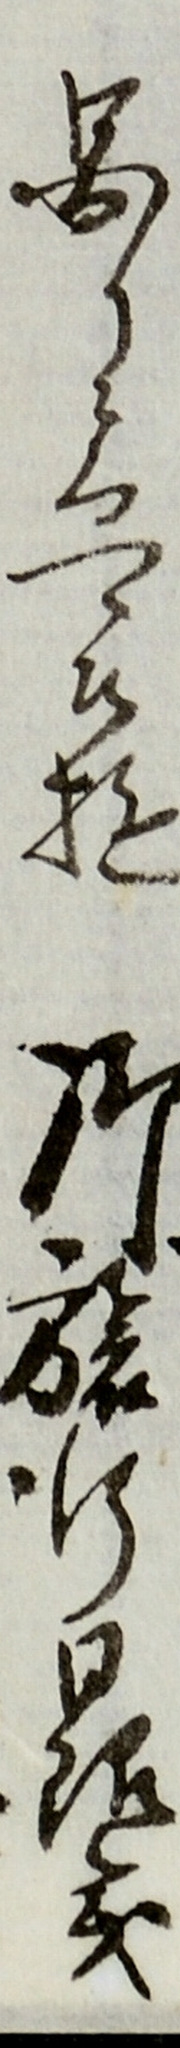図りニ而可被遊御旅行日限之義
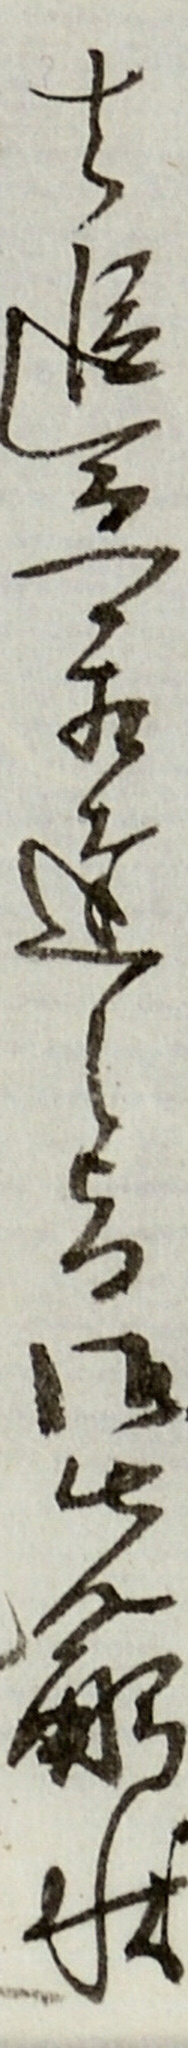者追而可相達之旨御先触状
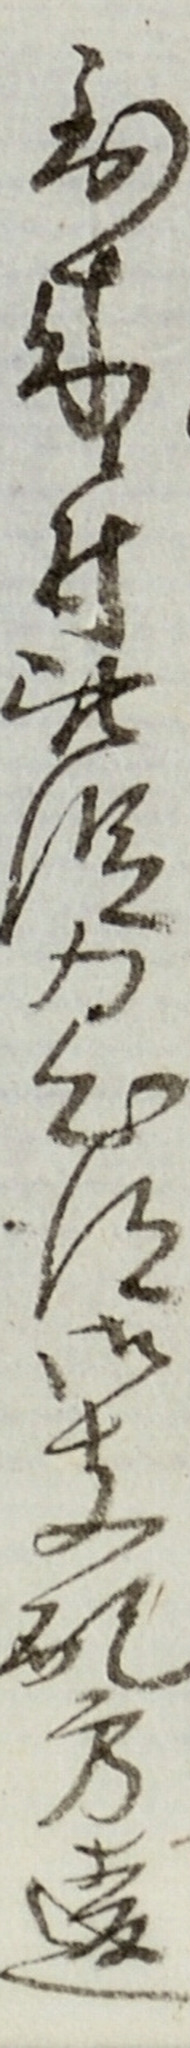到来ニ付此段為心得御支配方違
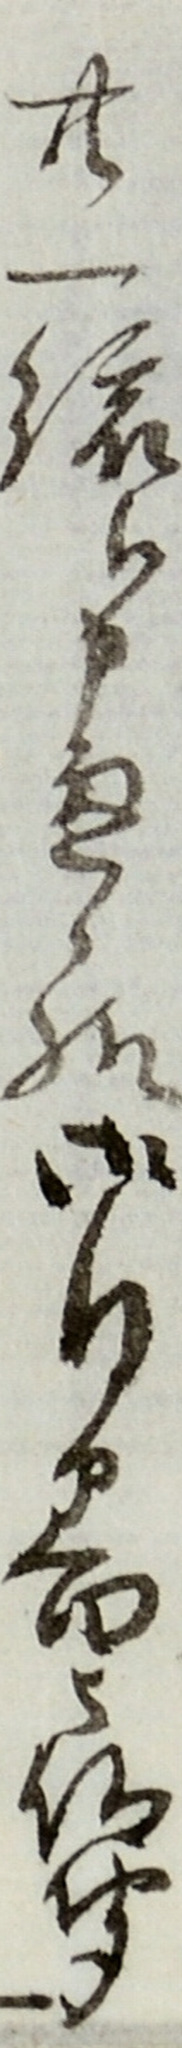共一統江申通候様御月番被仰聞
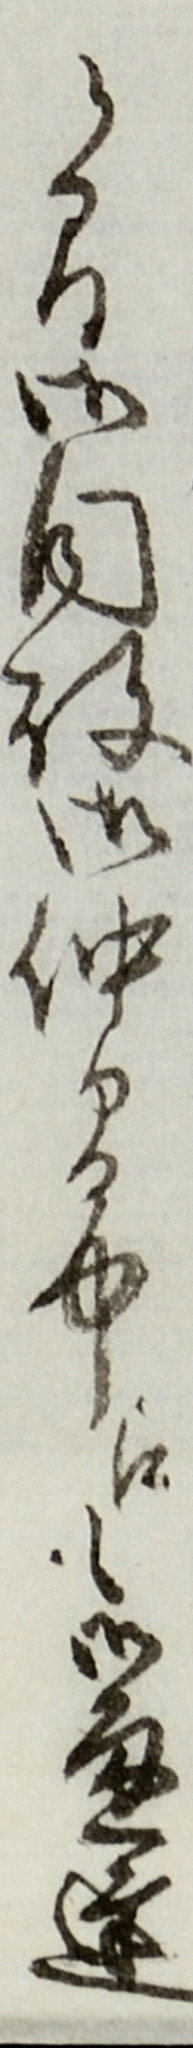候間御同役御仲間中江も御通達
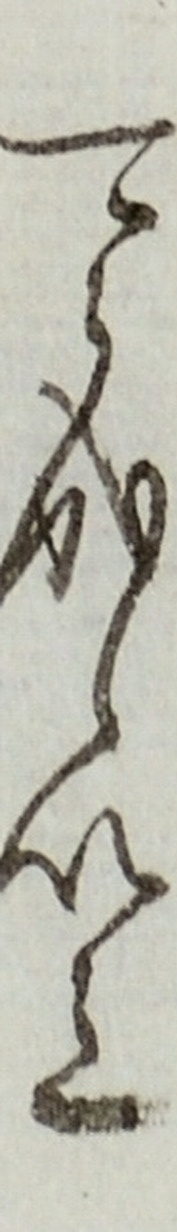可被成候以上
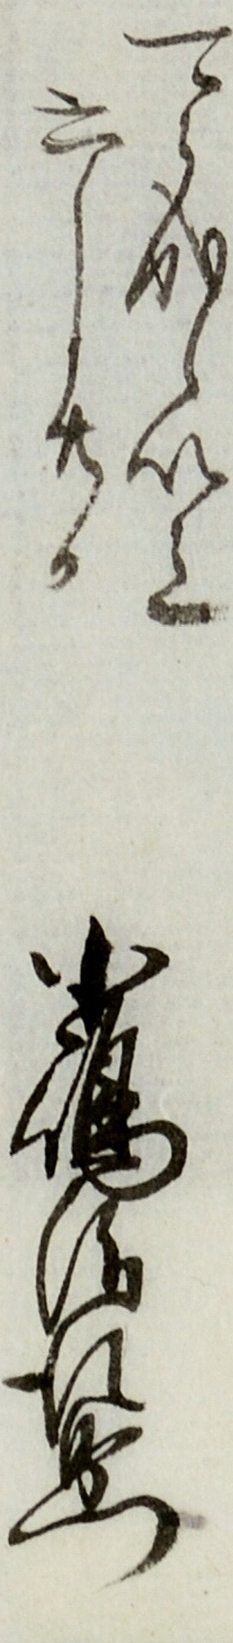六月廿日小嶋治左衛門
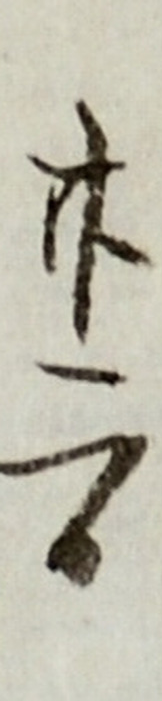廿二日
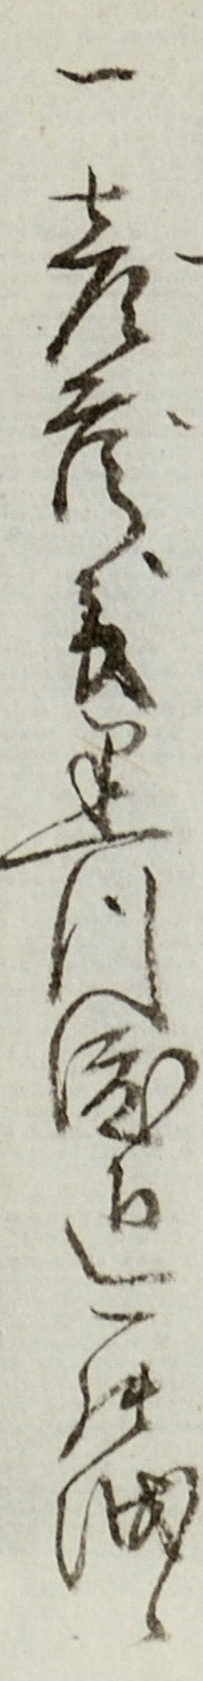一彦蔵義黒川渡江罷越候
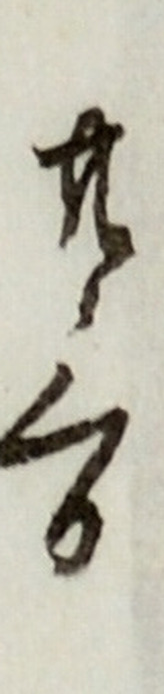廿三日
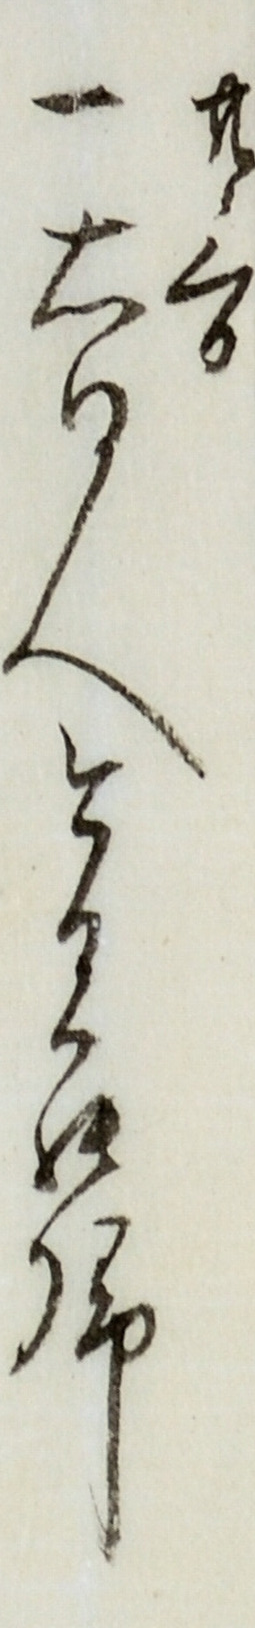一右同人今日罷帰
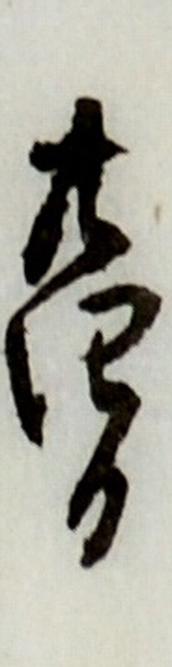廿四日
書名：御山方御薪方諸事御用留
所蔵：伊那市立高遠町図書館・合同会社AMANE
